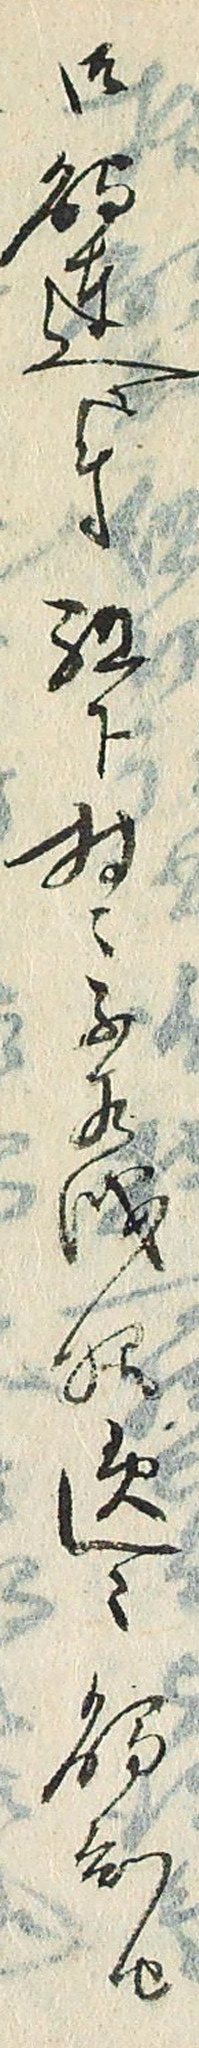御触達に付き組下村々不相洩様逸々触知せ
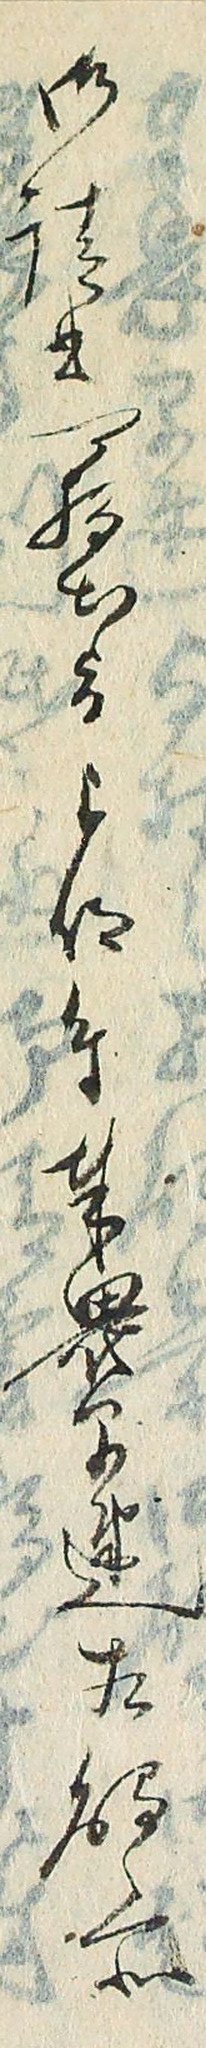御請書可指出旨被仰付奉畏早速相触候所
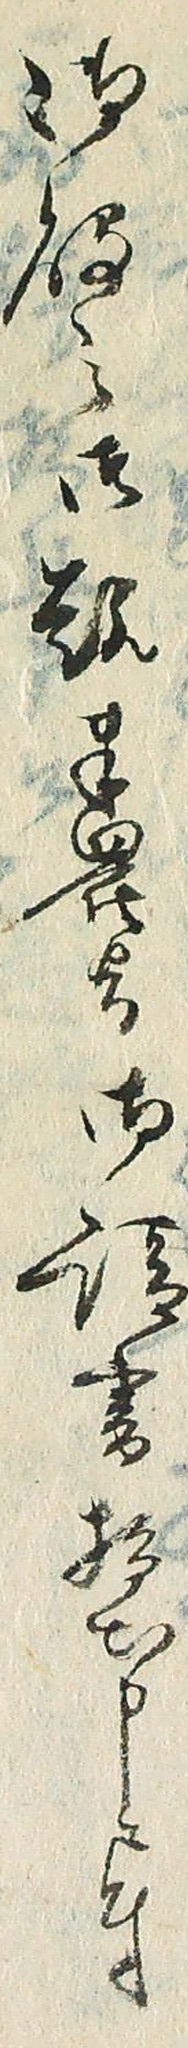御触之御趣奉畏旨御請書指出申に付
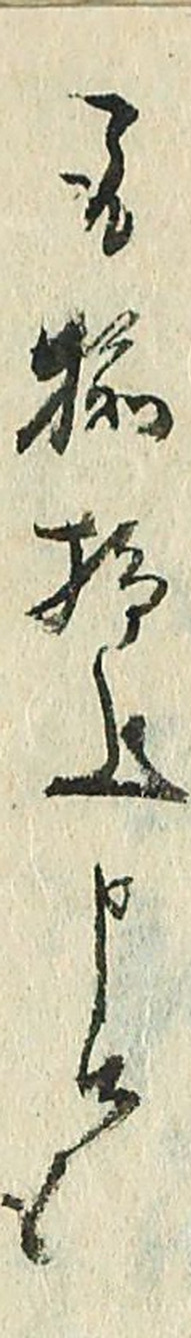取揃指上申候以上
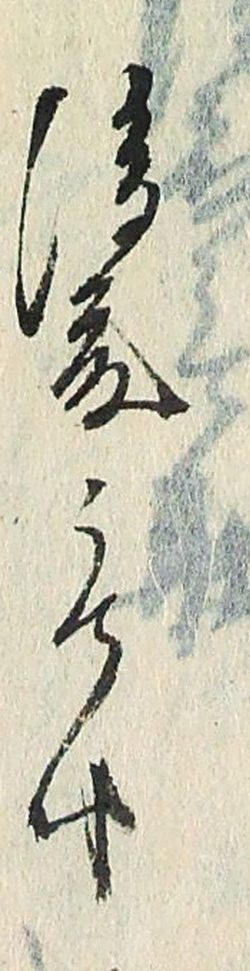後藤庄助
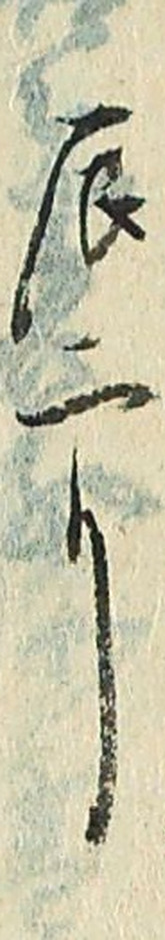辰二月
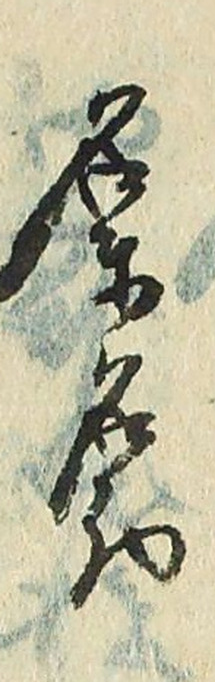名東名西
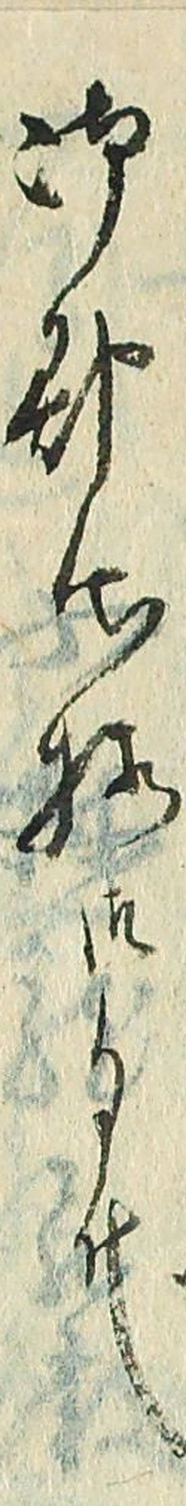御郡代様御手代
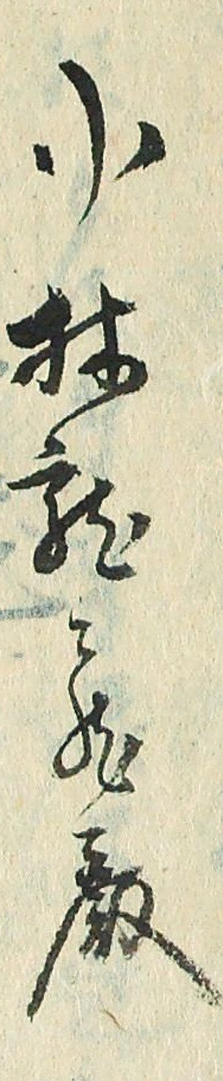小林龍蔵殿
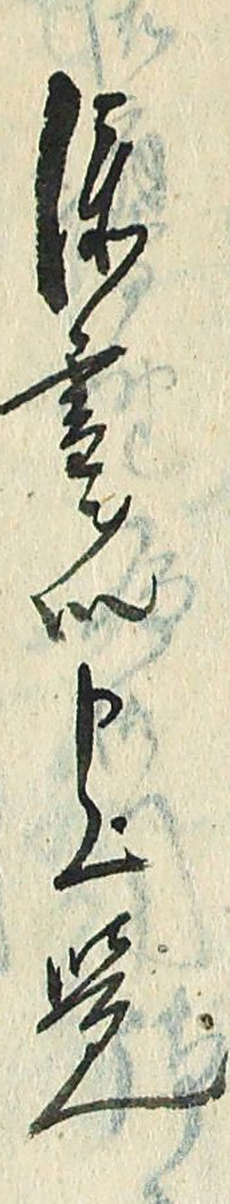添書を以申上覚
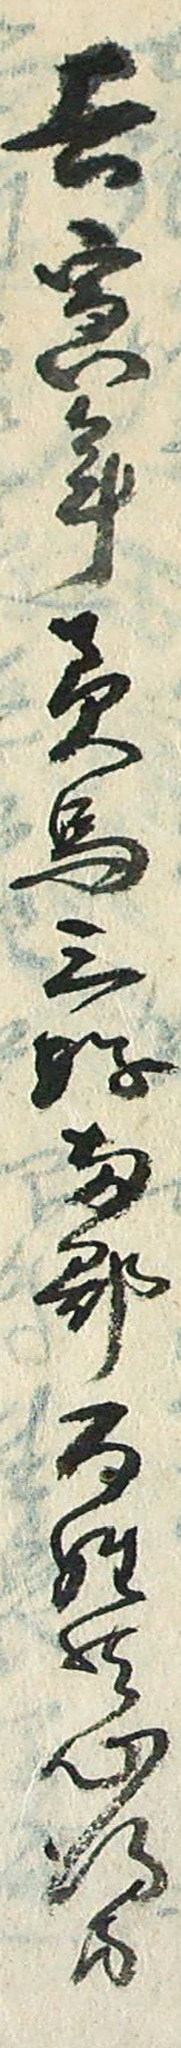去寅年美馬三好両郡百姓共心得方

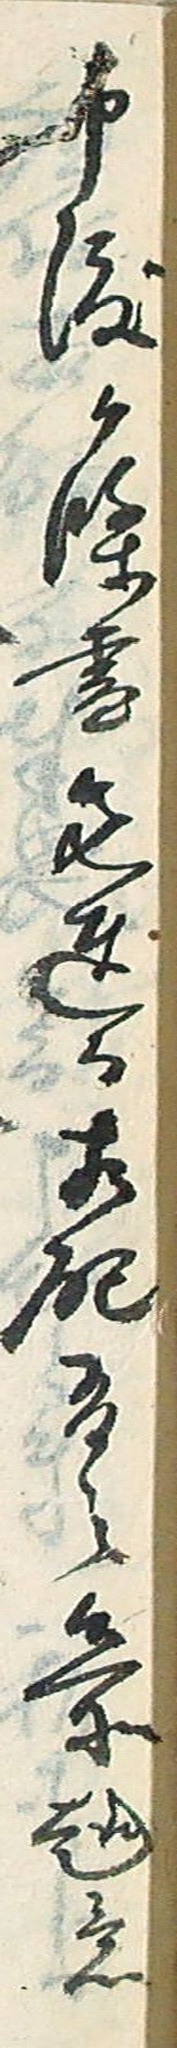申渡ケ條書先達而相配有之候所趣意
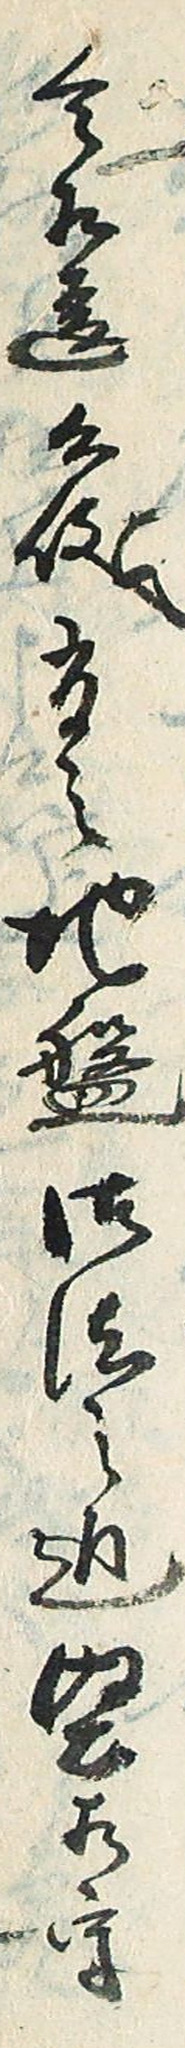無相違候儀有之地盤御法之通堅相守
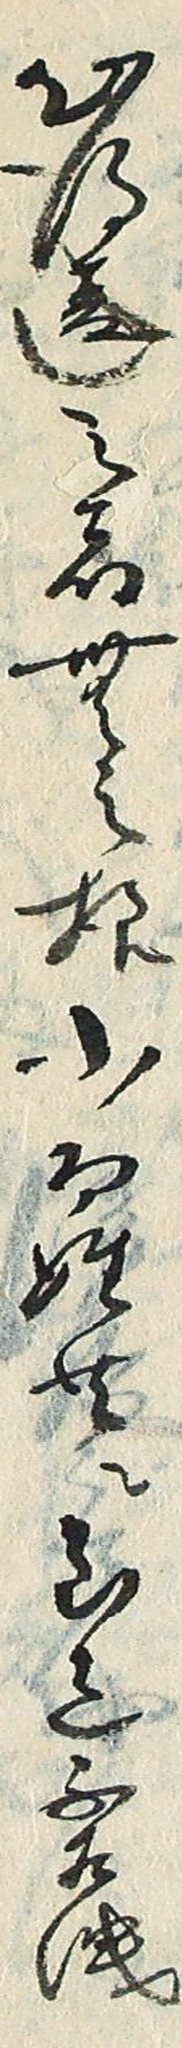心得違之者無之様小百姓共に至迄不相洩
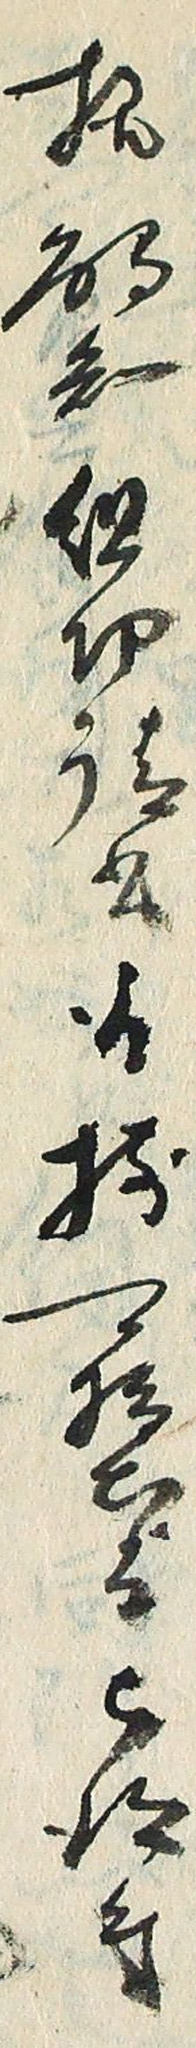様触知組切請書取揃可指出旨被仰付
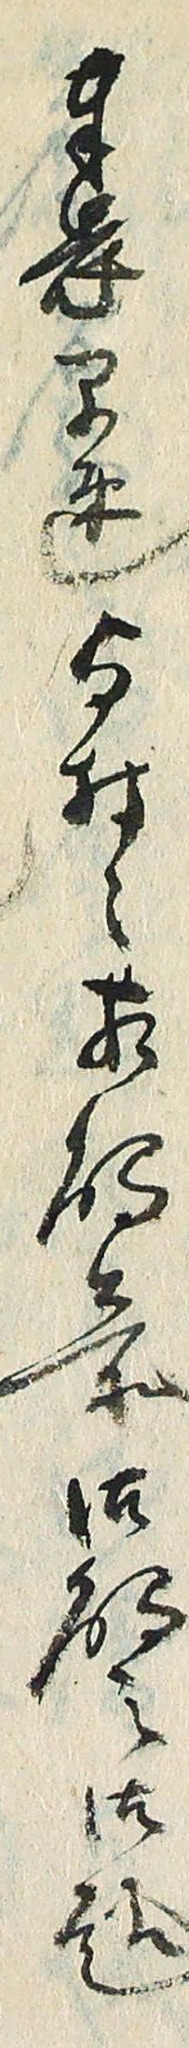奉畏早速与村々相触候所御触之御趣
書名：諸御用御□受書控
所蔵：鳴門教育大学 Naruto University of Education
